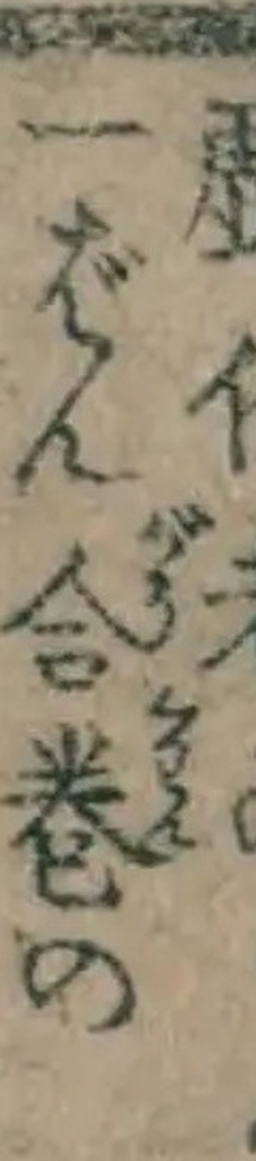一ばん合巻の
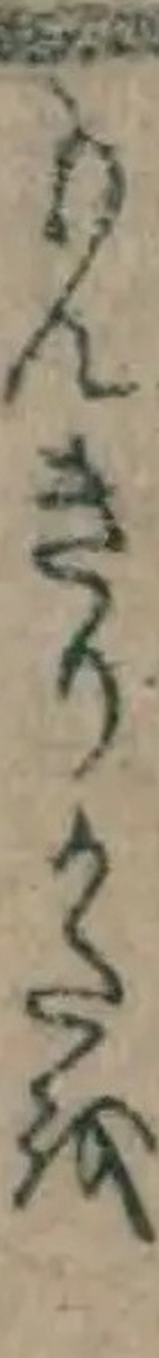もんきりかたを
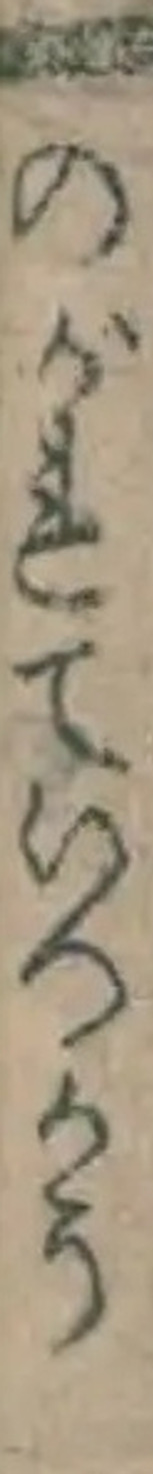のがれていつかう
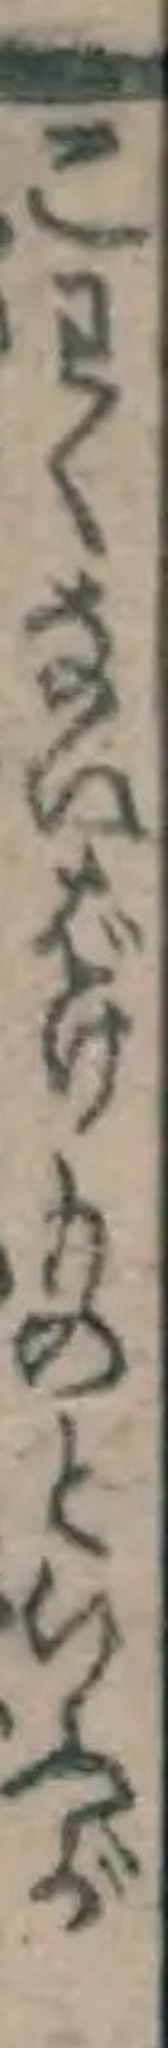こわくないばけものといふが
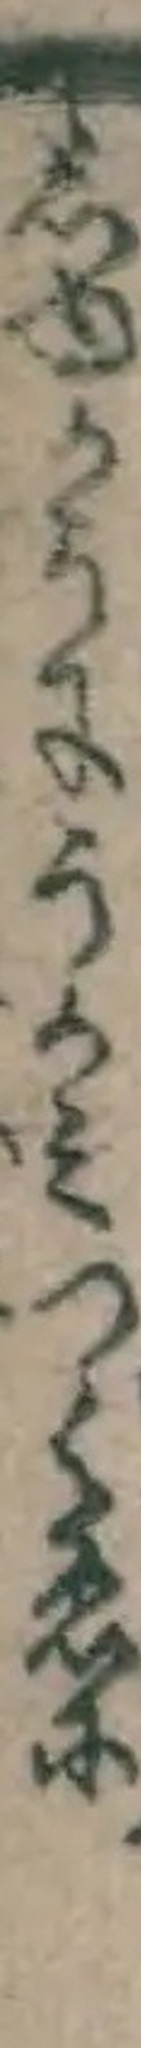しゆかうにうかみつくゑに
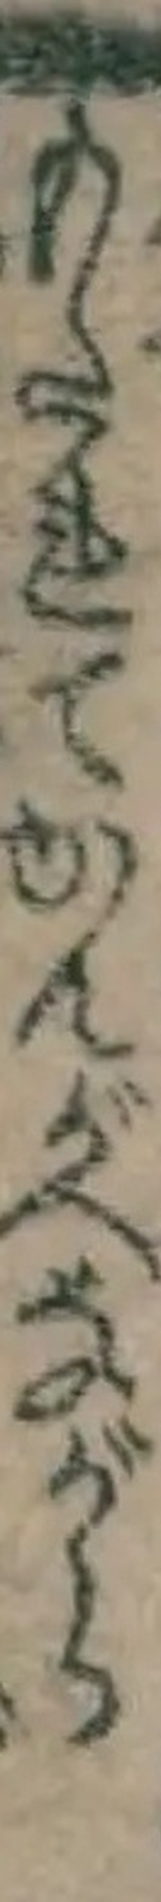もたれてかんがへながら
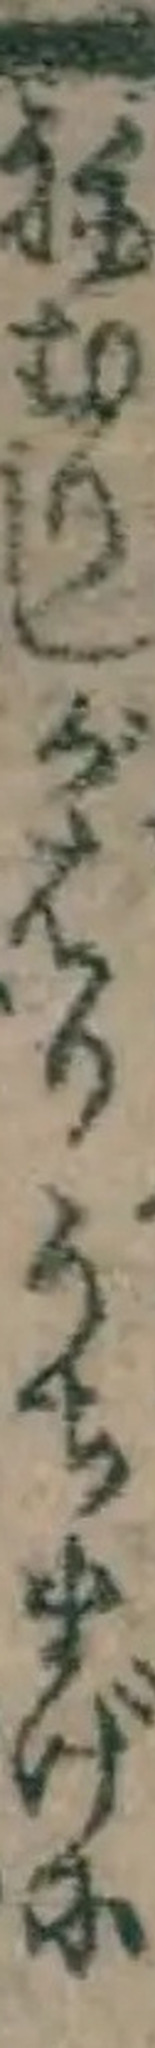ねむりしがはりうちまげに
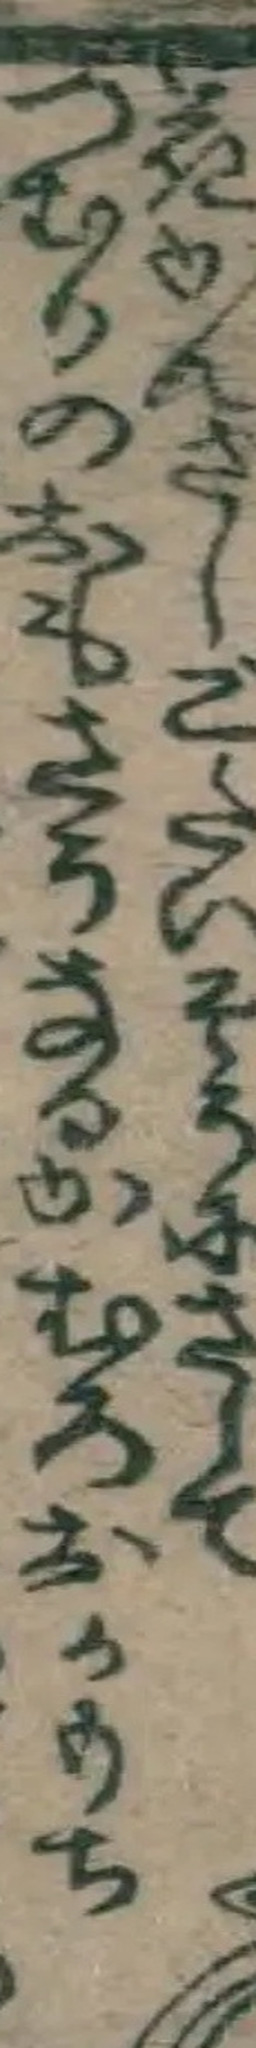つむりのおもさうなるかむろおかもち
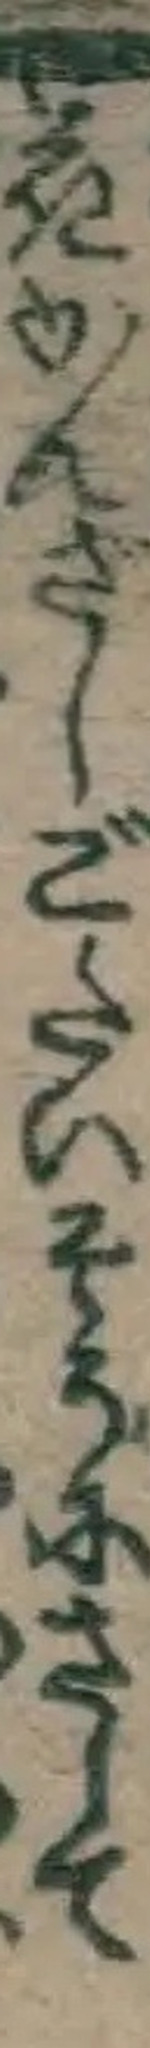花かんざしごたいそうにさして
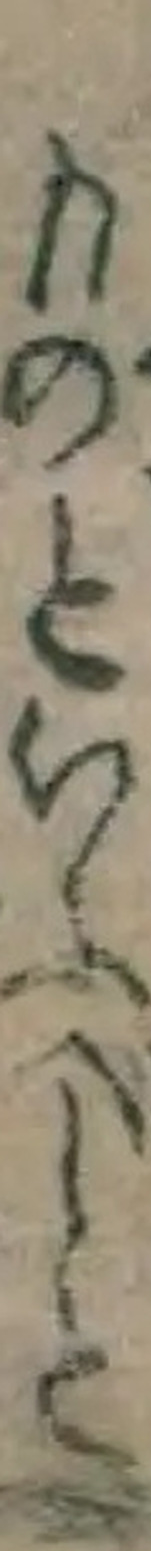ものといふべしと
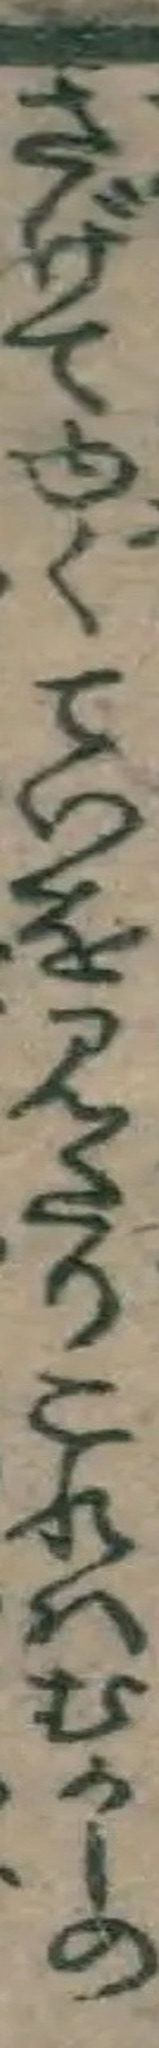さげてゆくていを見たりこれはむかしの
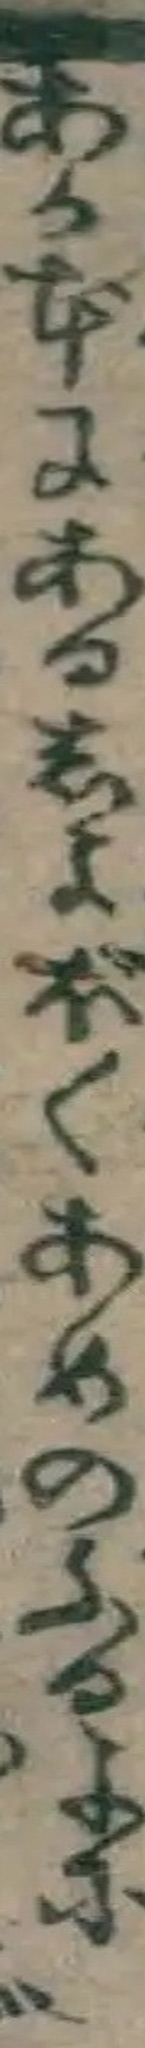あか本にあるしよぼ〳〵あめのふるよに
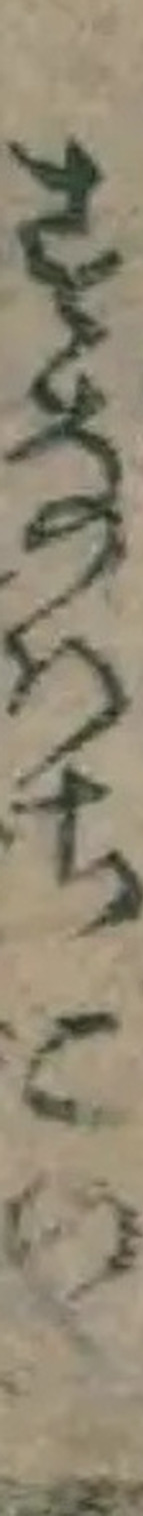すなはちこの
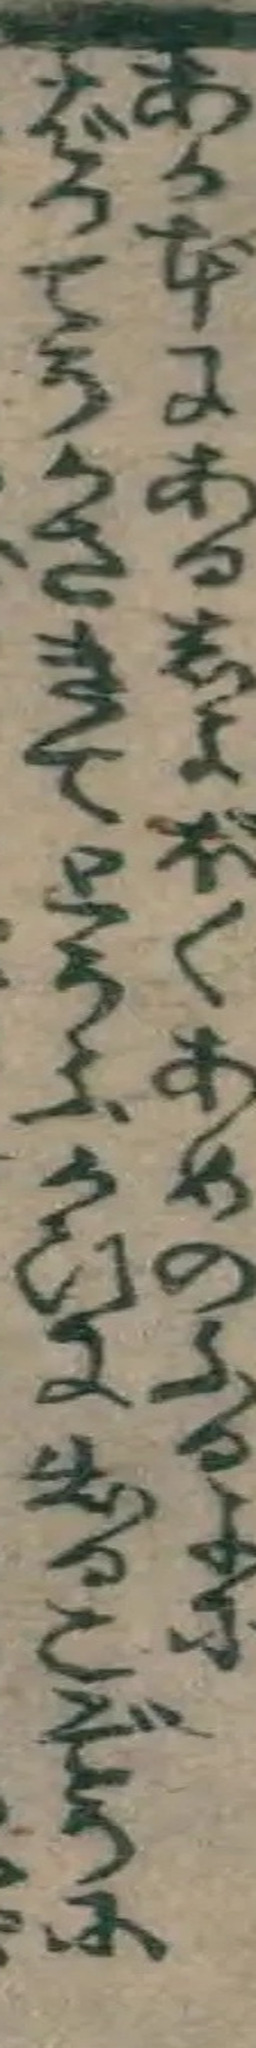ばつてうかさきてとうふかいに出るこぞうに
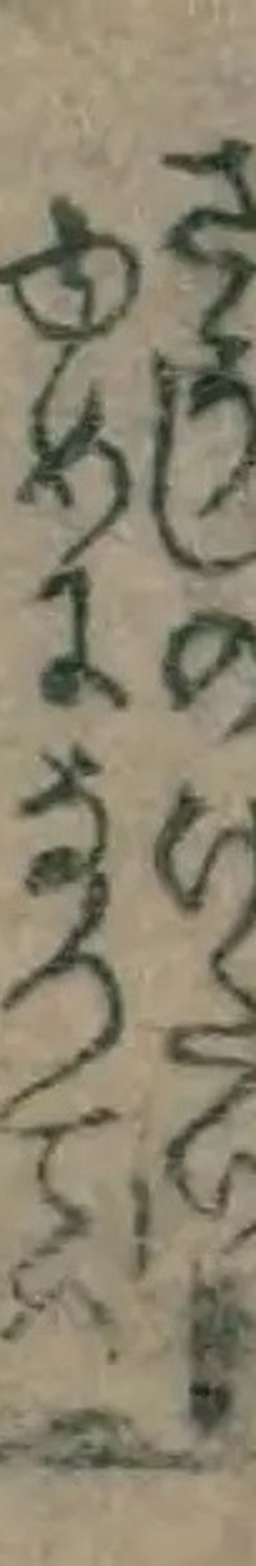ゆめになつては
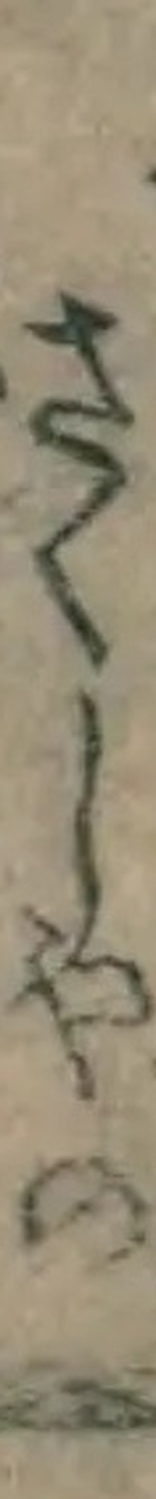さくしやの
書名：大時代唐土化物 3巻
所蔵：国立国会図書館 National Diet Library, JAPAN
